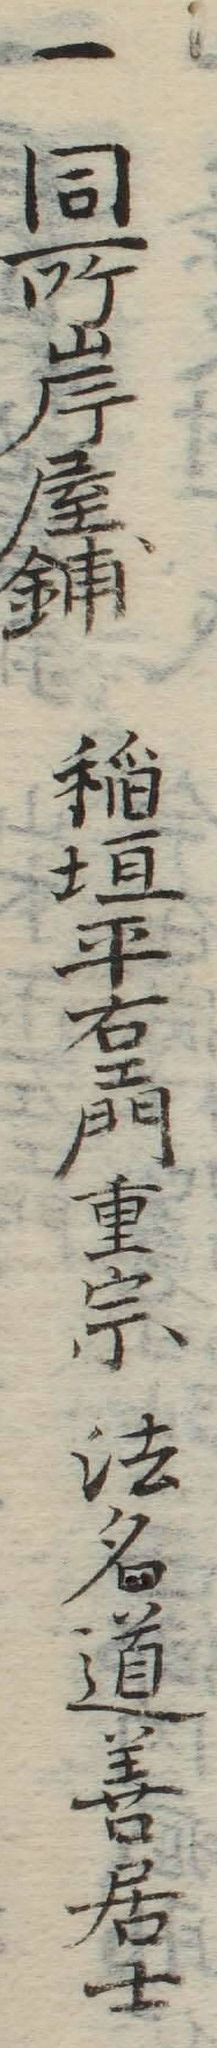一同所岸屋鋪稲垣平右エ門重宗法名道善居士

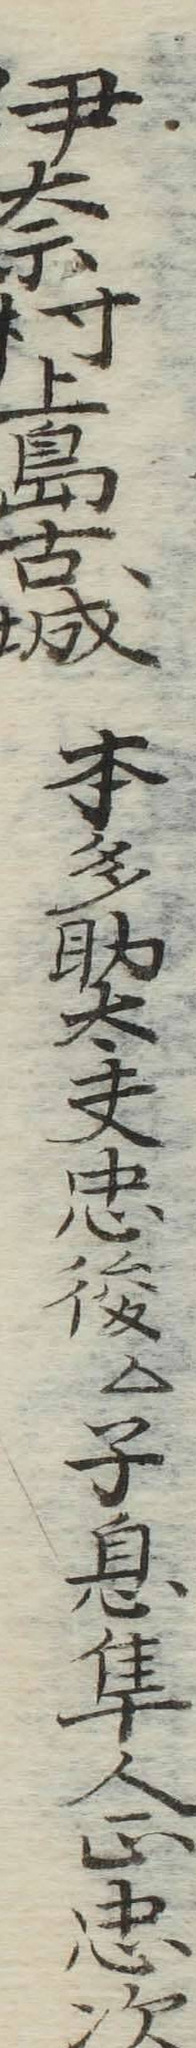一伊奈村上島古城本多助太夫忠俊△子息隼人正忠次
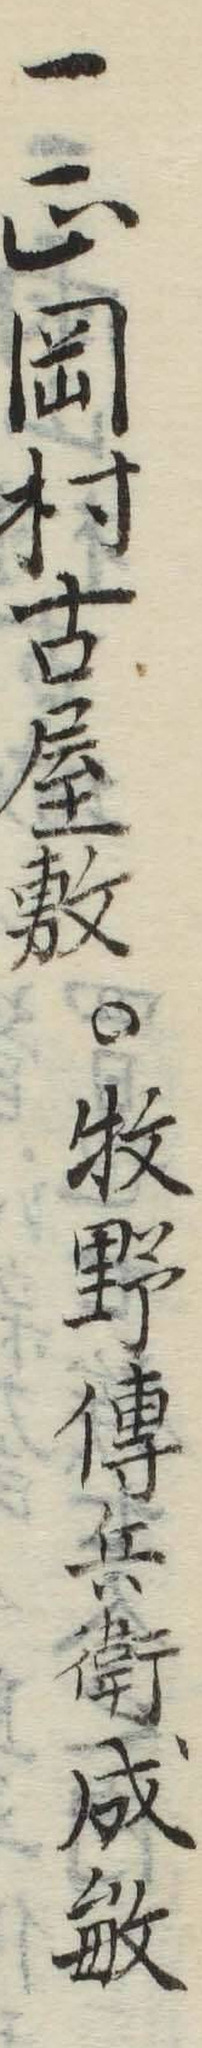一正岡村古屋敷○牧野伝兵衛成敏
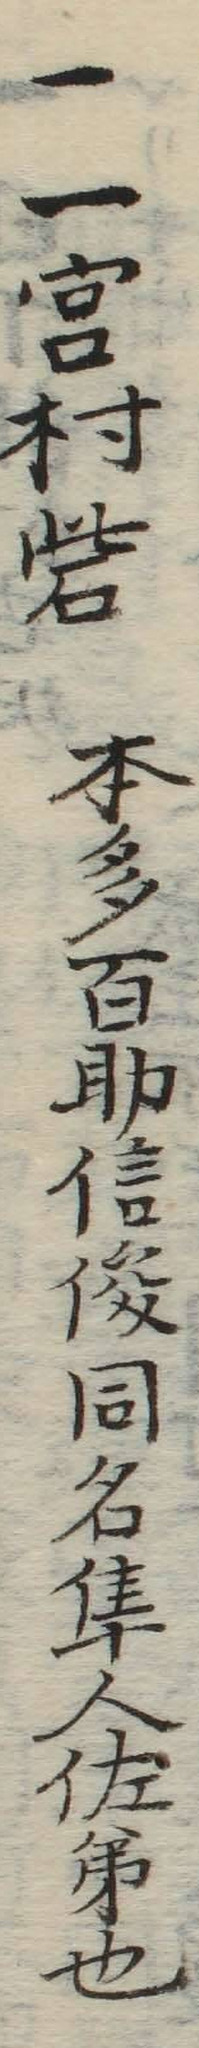一一宮村砦本多百助信俊同名隼人佐弟也

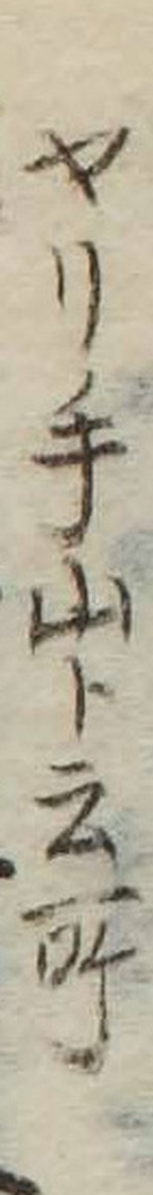ヤリ手山ト云所
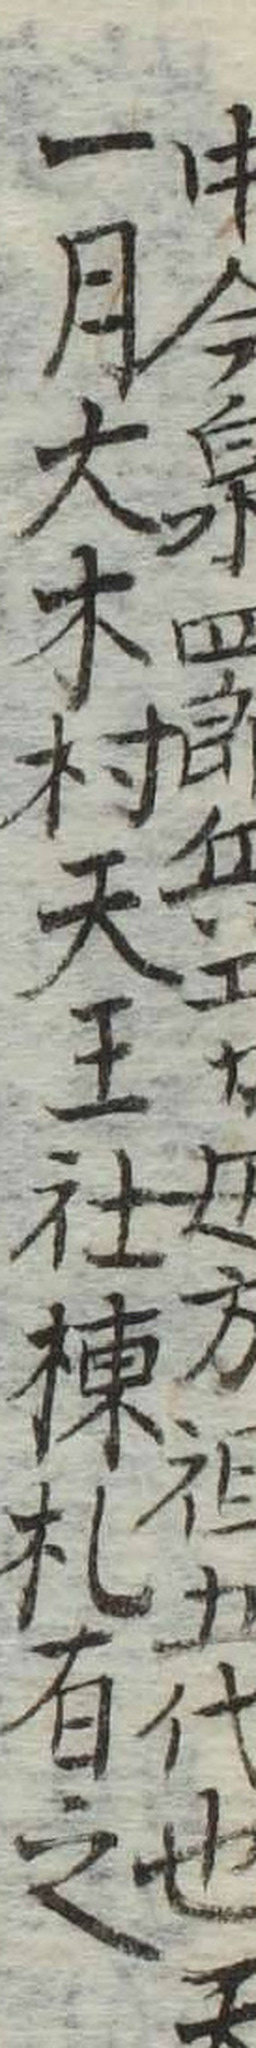一月大木村天王社棟札有之
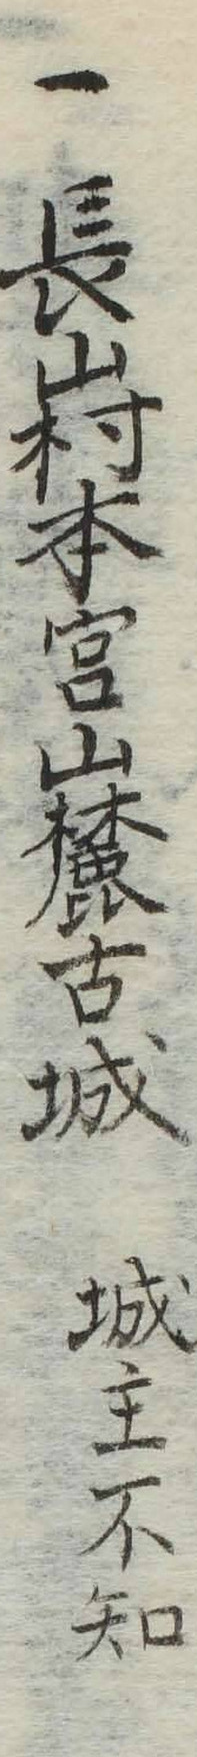一長山村本宮山麓古城城主不知
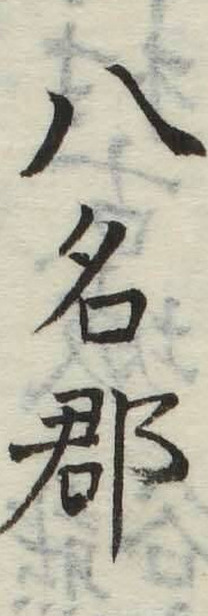八名郡
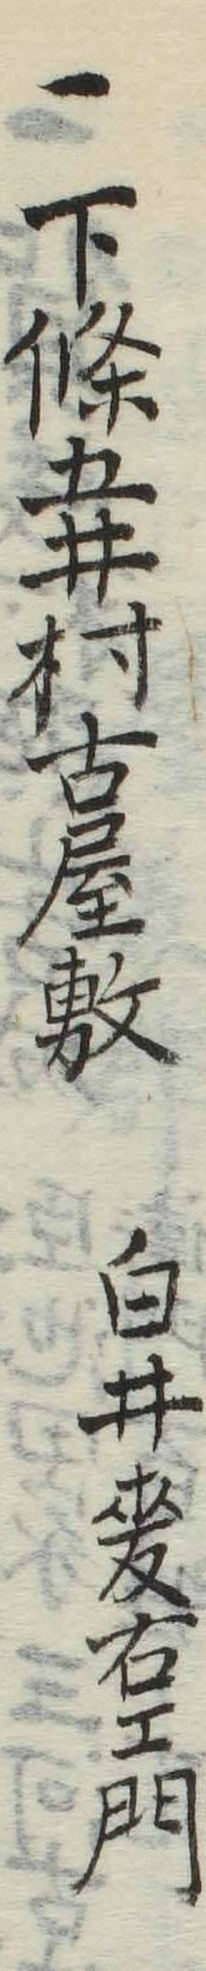一下條五井村古屋敷白井麦右エ門

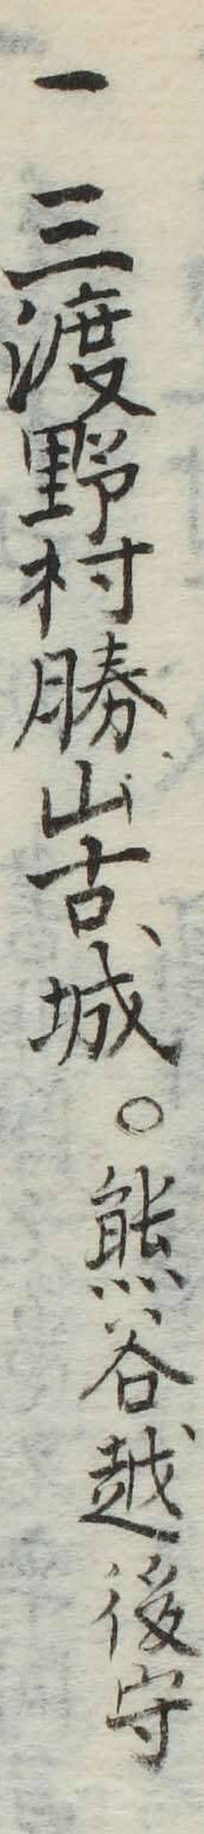一三渡野村勝山古城○熊谷越後守
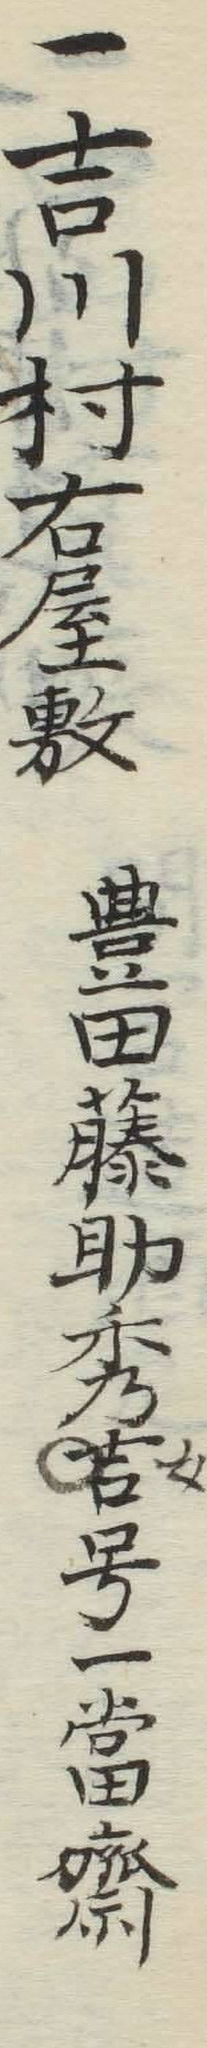一古川村古屋敷豊田藤助秀吉号一当斎
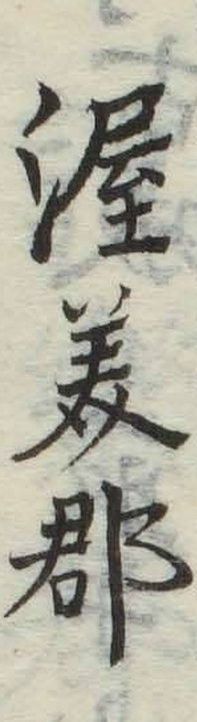渥美郡
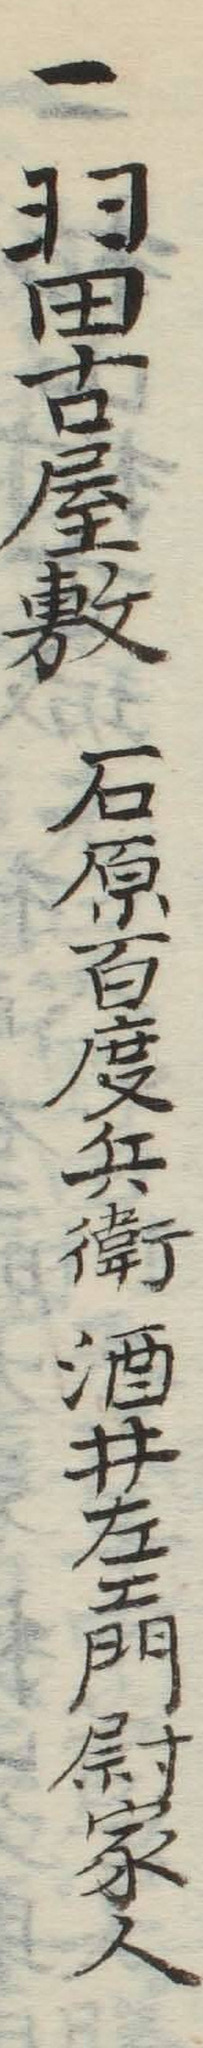一羽田古屋敷石原百度兵衛酒井左エ門尉家人
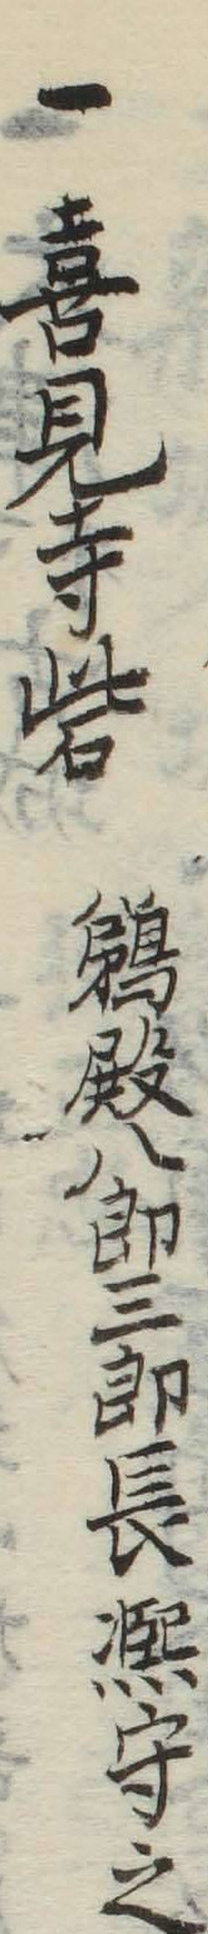一喜見寺砦鵜殿八郎三郎長煕守之
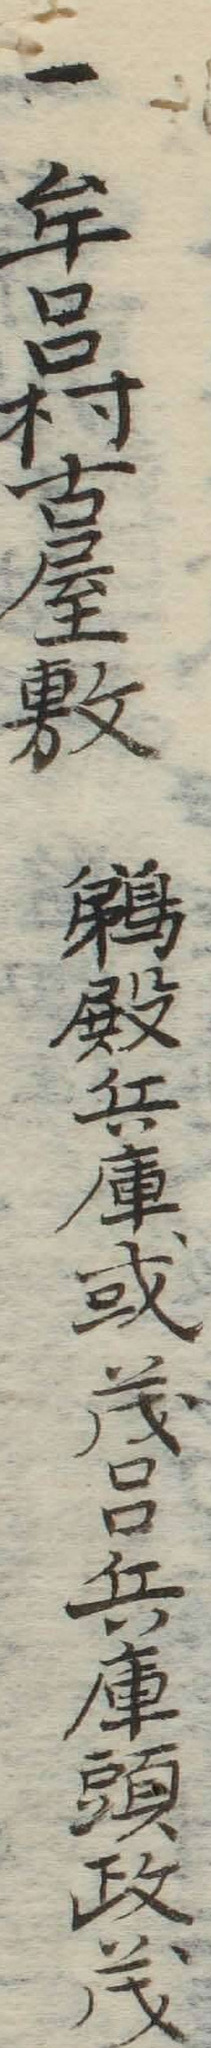一牟呂村古屋敷鵜殿兵庫或茂呂兵庫頭政茂

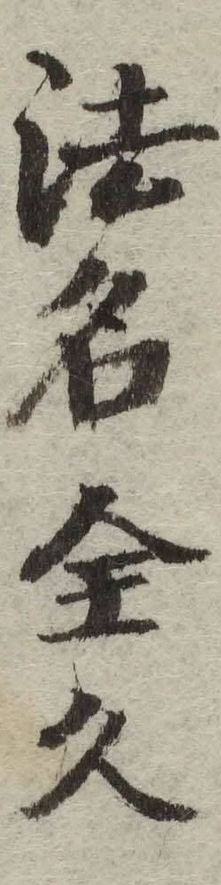法名全久
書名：三河国二葉松
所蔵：国文学研究資料館
